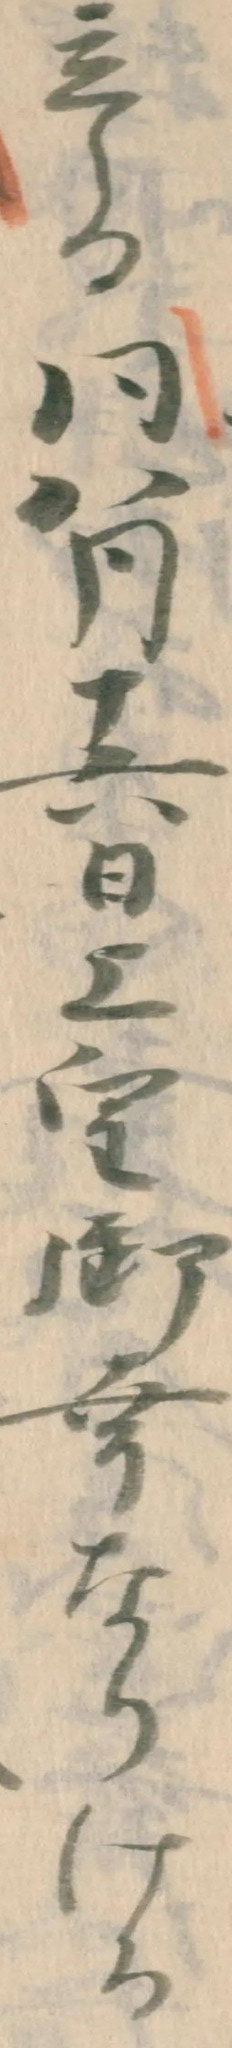立らる同八月十六日上皇御幸なりける
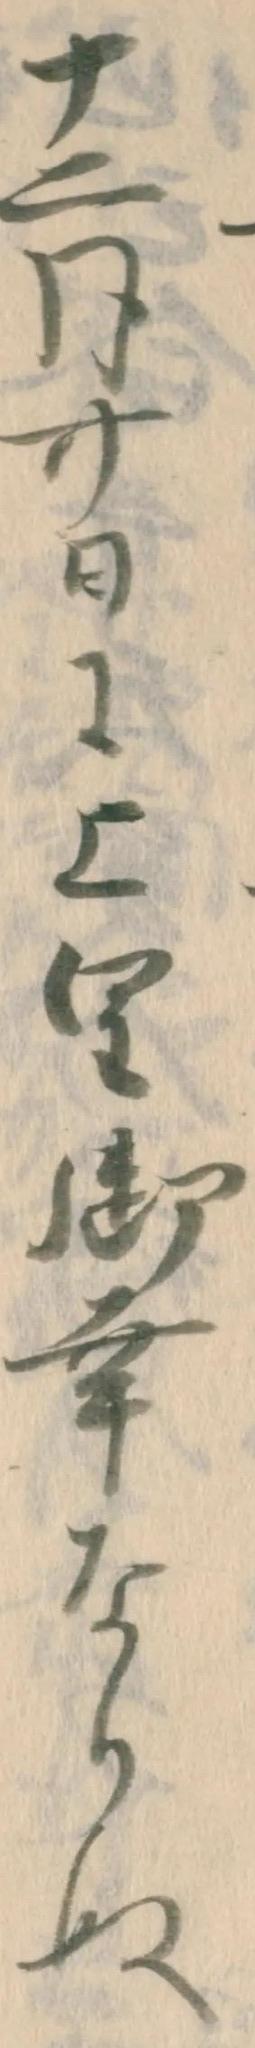十二月廿日に上皇御幸なりぬ
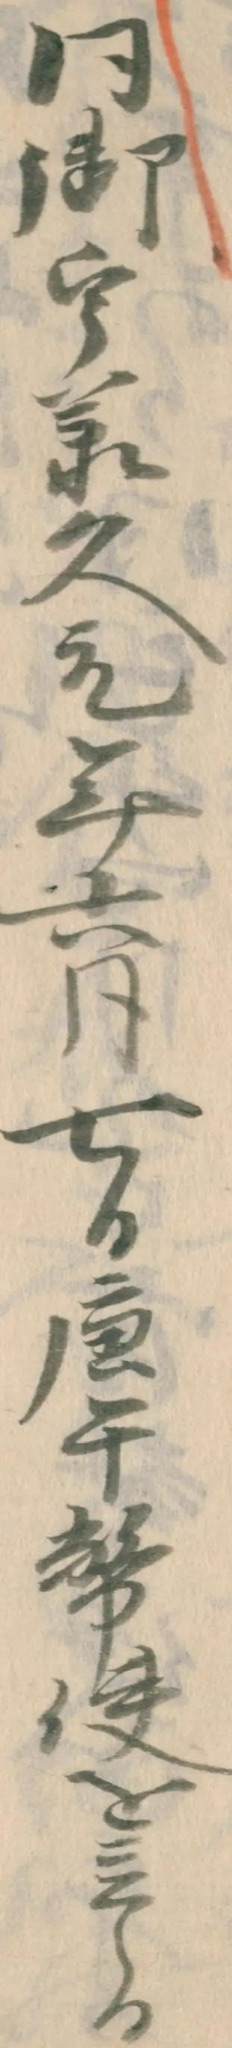同御宇承久元年六月七日庚午幣使を立らる
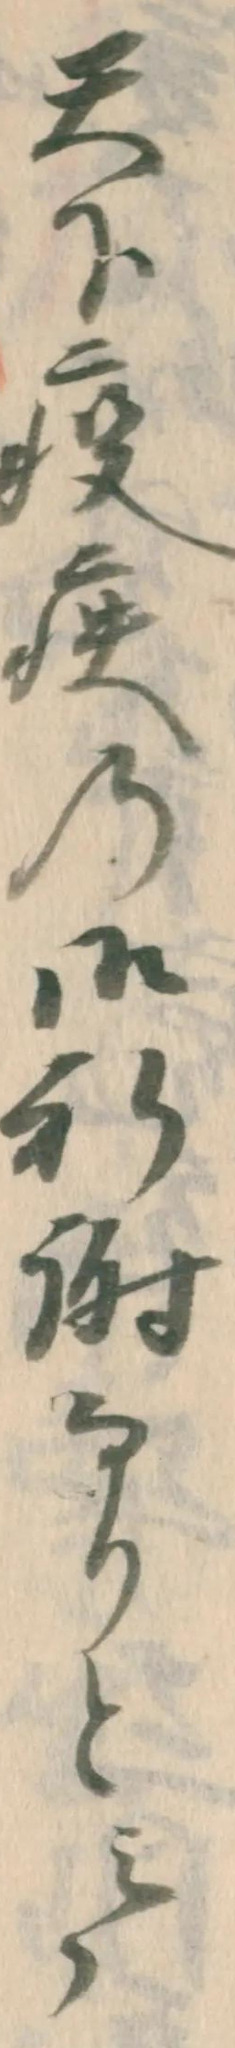天下疫疾の御祈謝なりと云〃
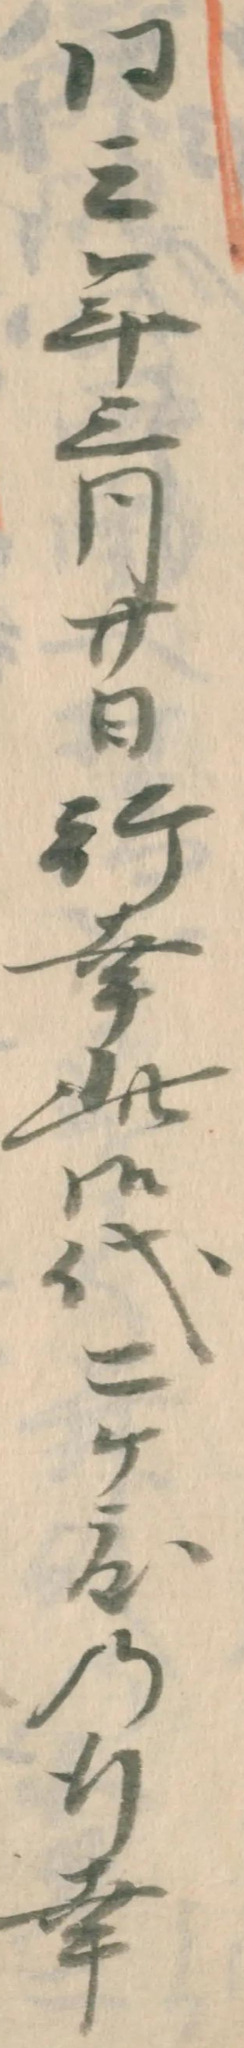同三年三月廿日行幸此御代二ヶ度の行幸
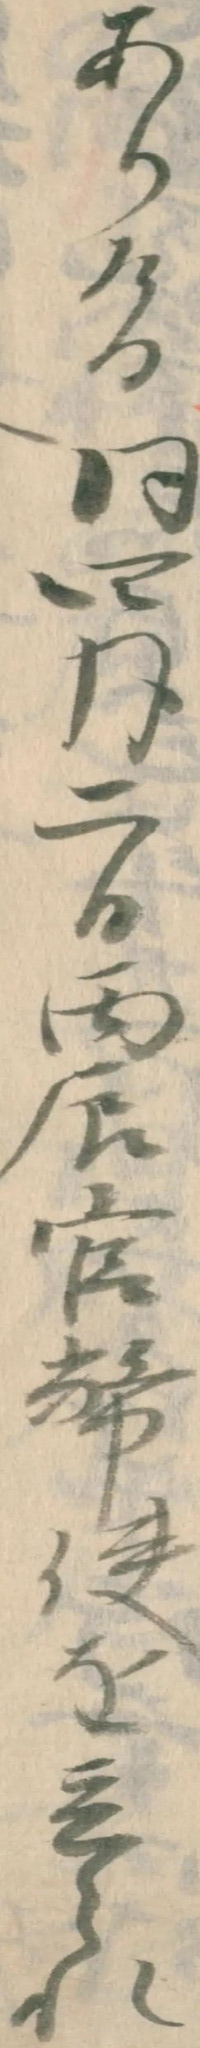ありける同四月二日丙辰官幣使を立られ

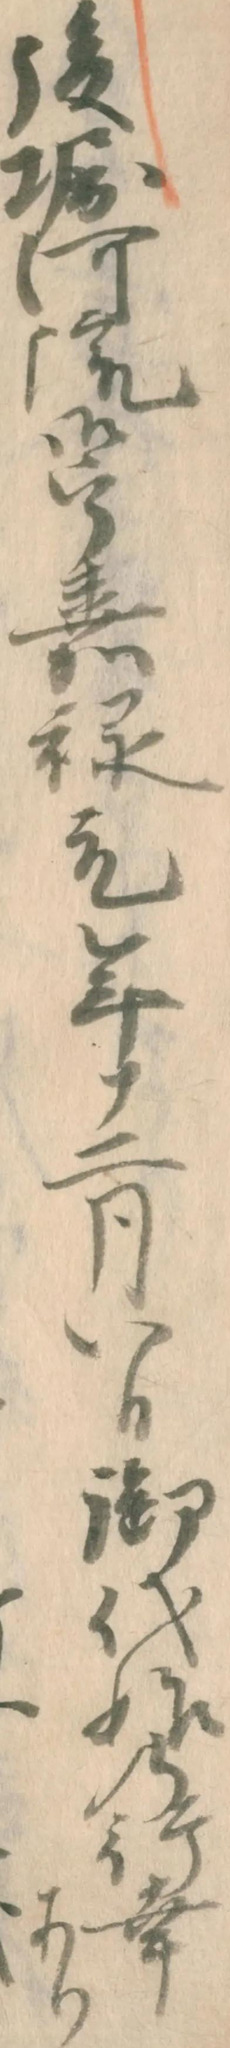後堀河院御宇嘉禄元年十二月八日御代始の行幸あり
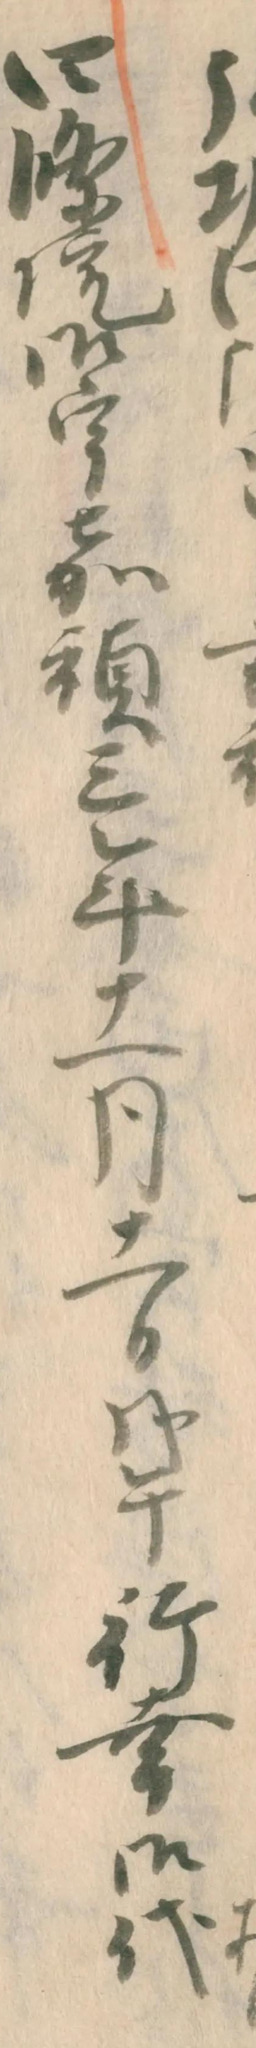四條院御宇嘉禎三年十一月十一日戊午行幸御代
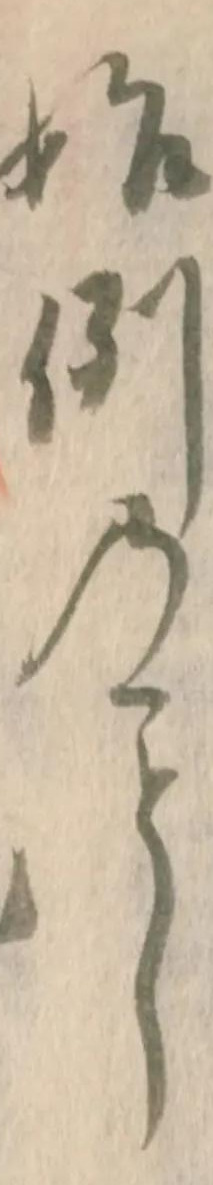始例のことし
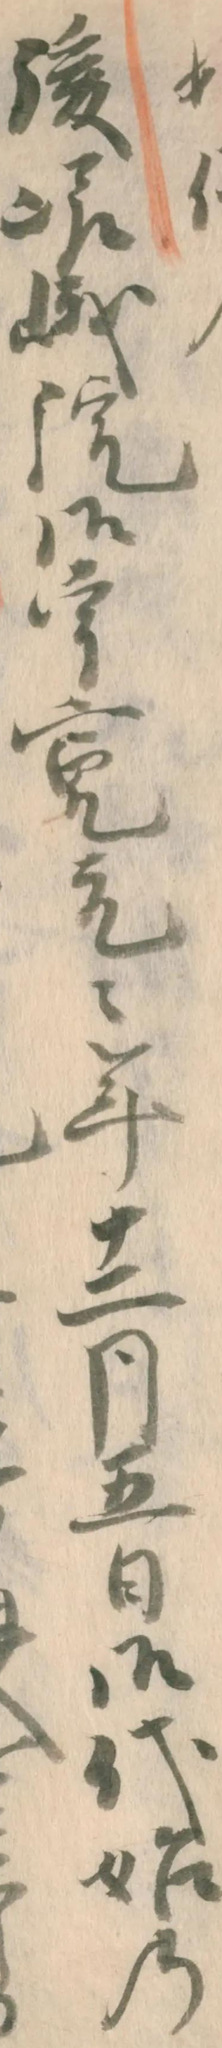後嵯峨院御宇寛元々年十二月五日御代始の
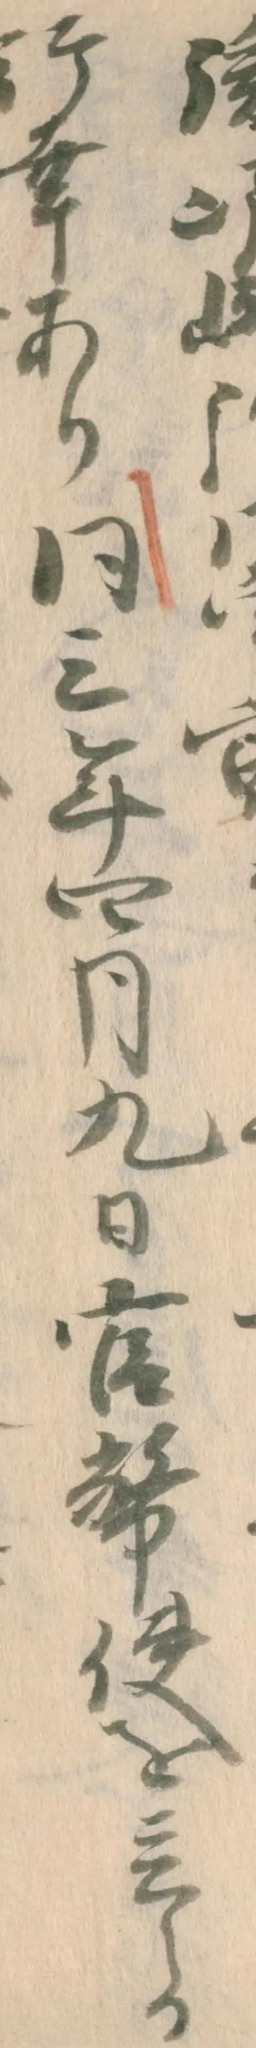行幸あり同三年四月九日官幣使を立らる
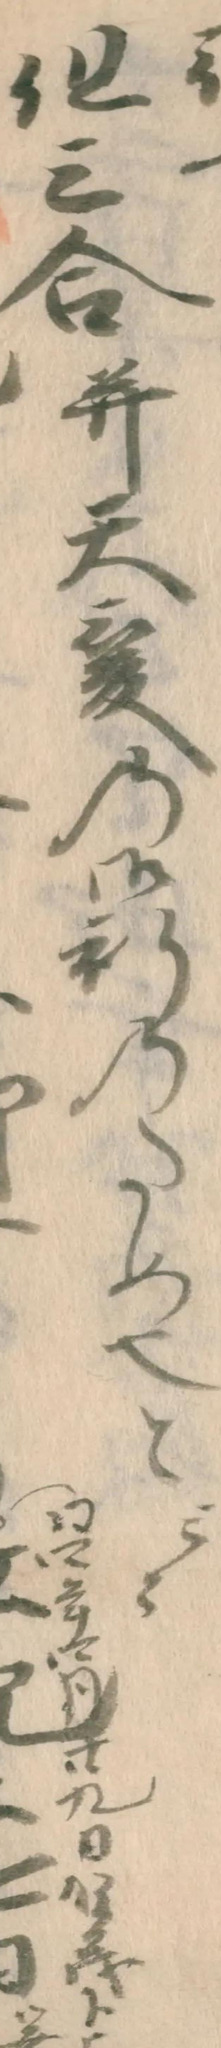但三合并天変の御祈のため也と云々
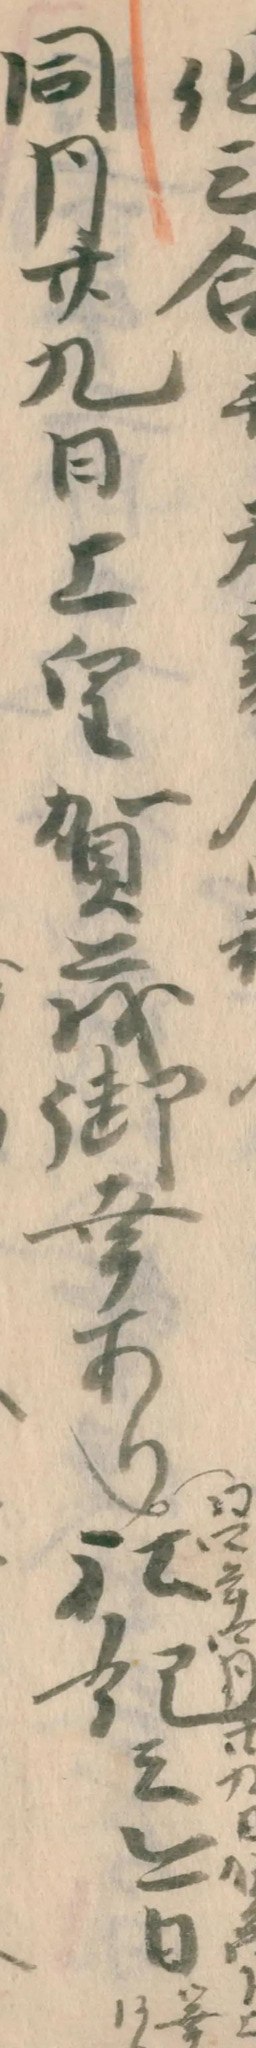同月廿九日上皇賀茂御幸あり◦社記云今日
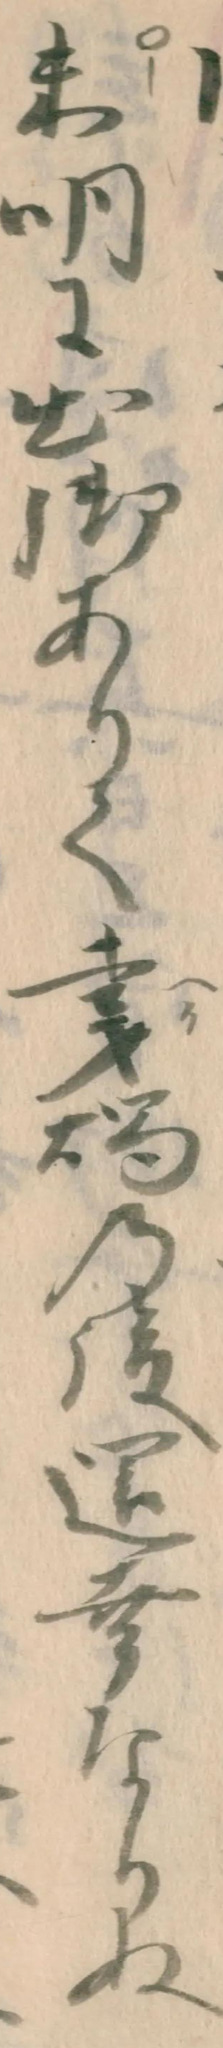未明に出御ありて秉燭の後還幸なりぬ
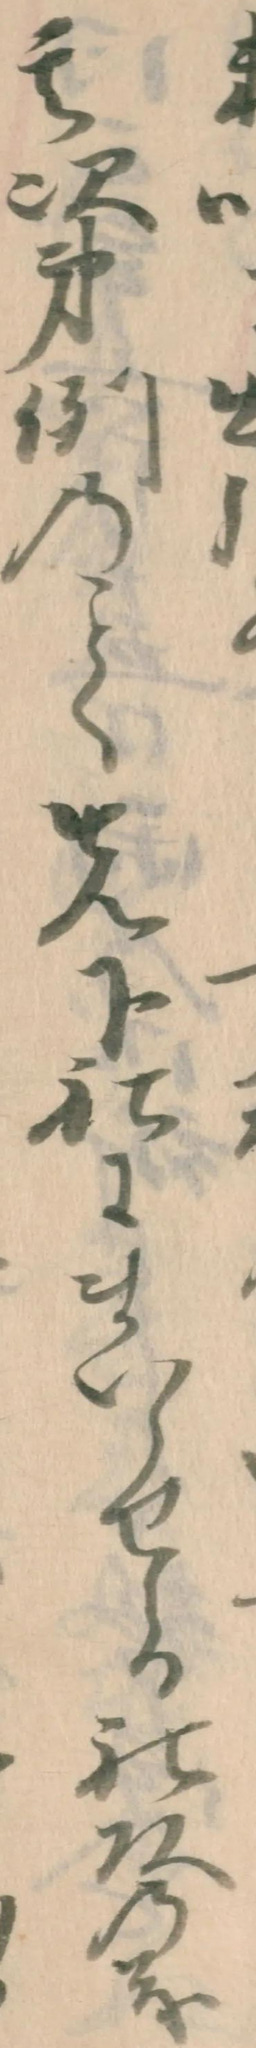其次第例のことく先下社にまいらせらる社頭の義
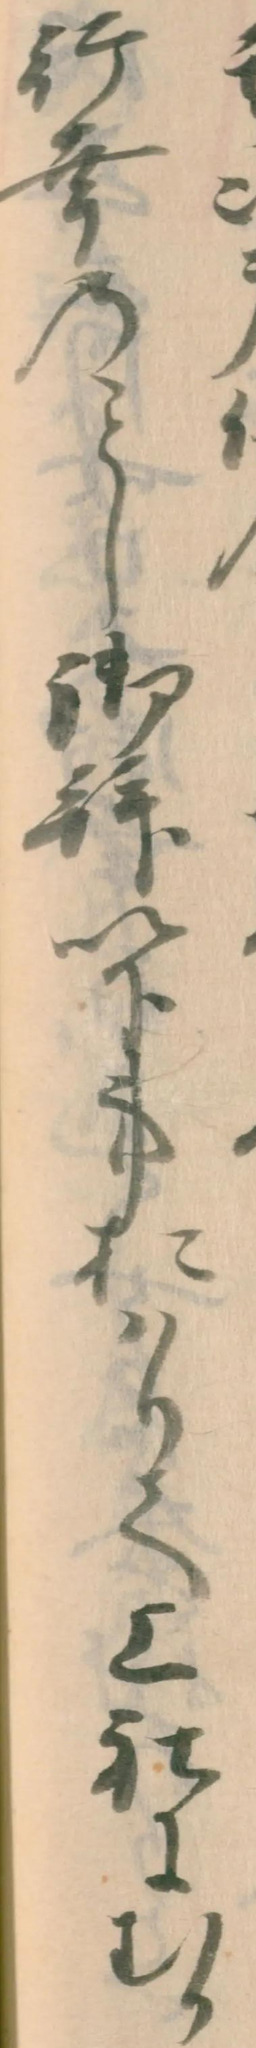行幸のことし御拝以下事おはりて上社にむか
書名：賀茂社記録. 第1冊
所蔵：国立国会図書館 National Diet Library, JAPAN
